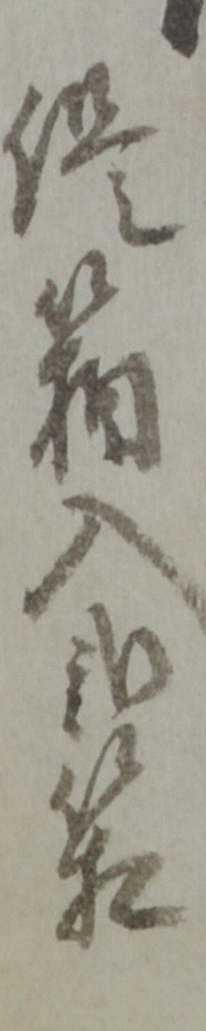但シ箱入弐箱
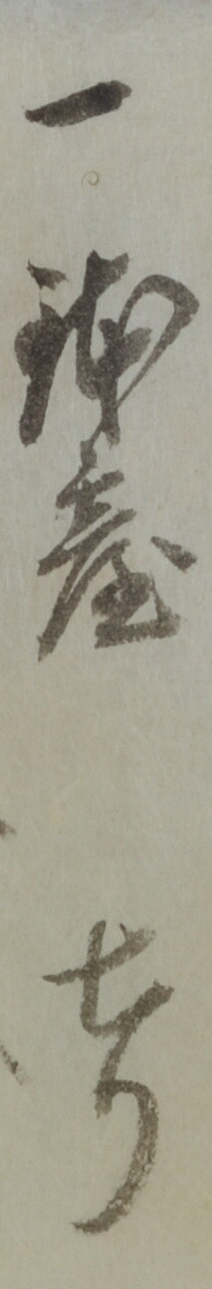一鉢台七ツ
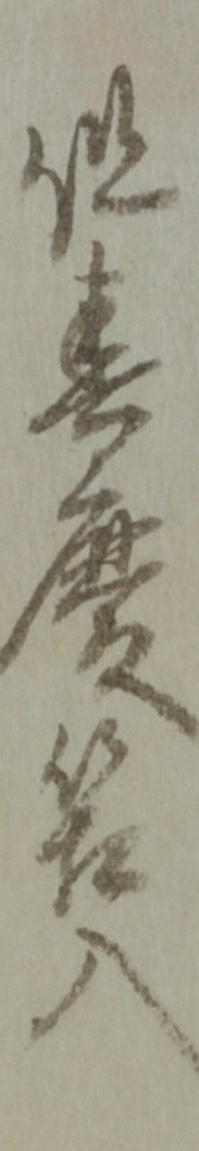但春慶箱入
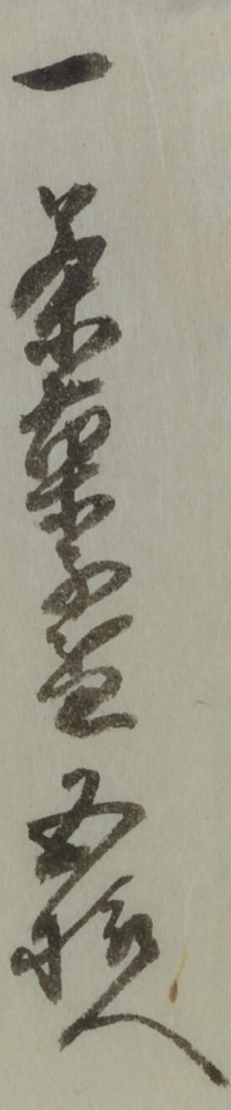一茶菓子盆五拾人
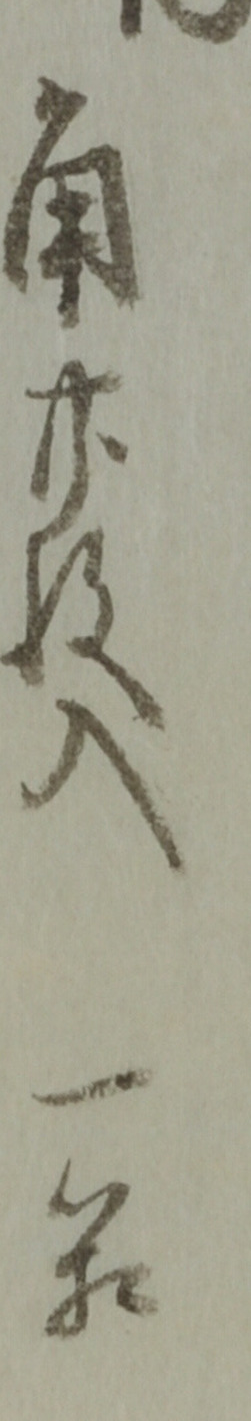角廿枚入一箱
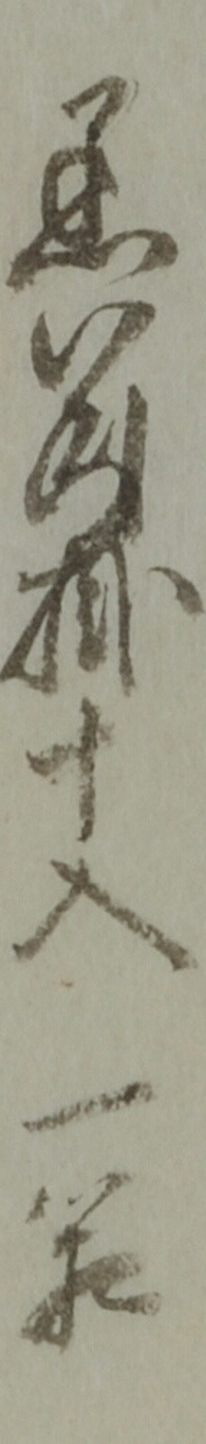黒いろ掛拾入一箱
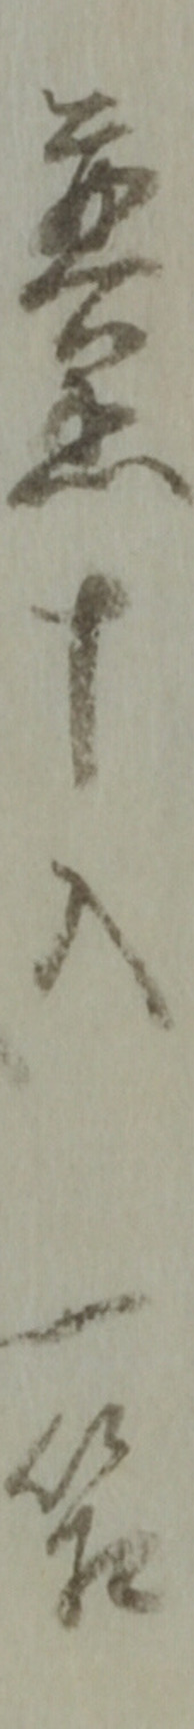並黒十入一箱
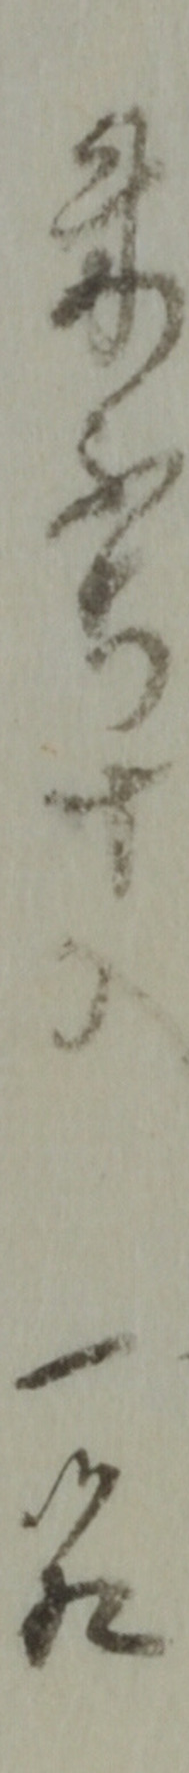朱ふち十入一箱
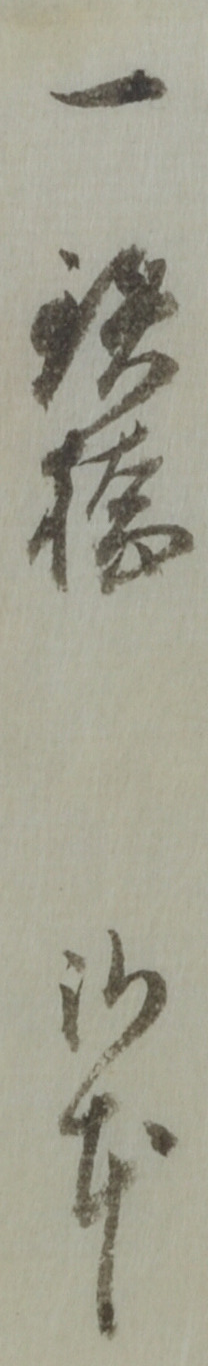一鉄橋弐本
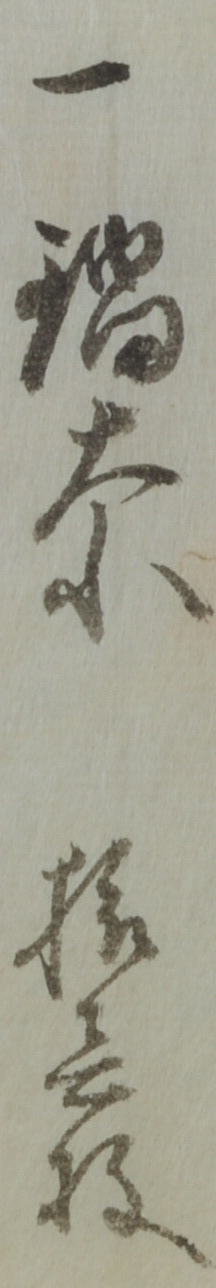一鍋大小拾壱枚
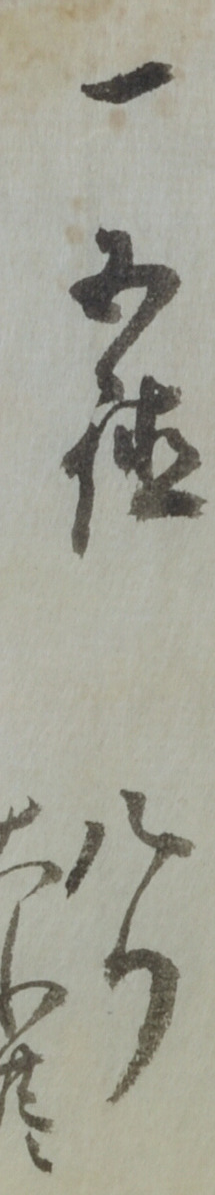一五徳八ツ
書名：遊行上人様御宿寺惣世話控
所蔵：伊那市立高遠町図書館・合同会社AMANE
